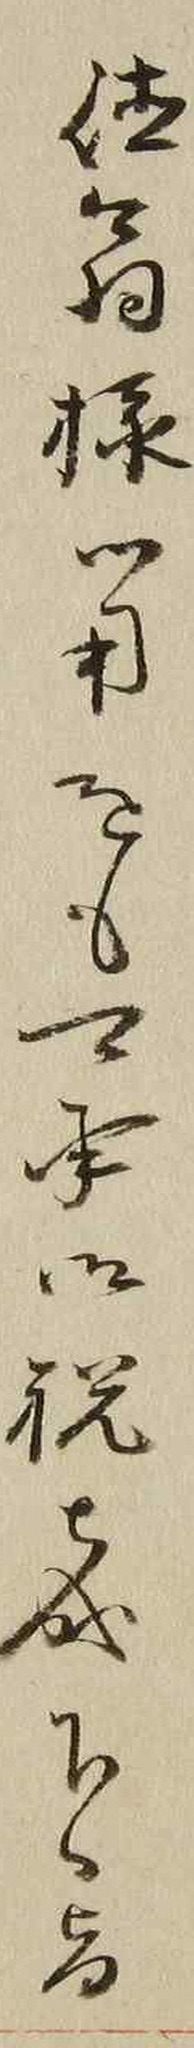徳翁様御用をも可承御祝被成下候旨
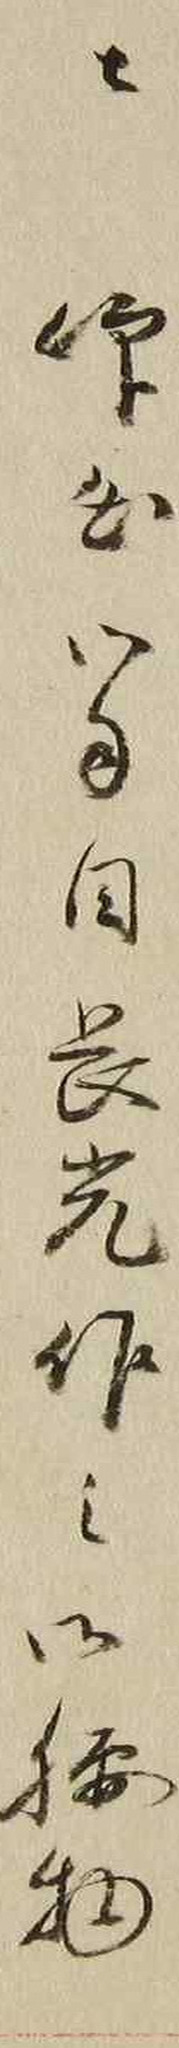被仰出御手自長光作之御腰物
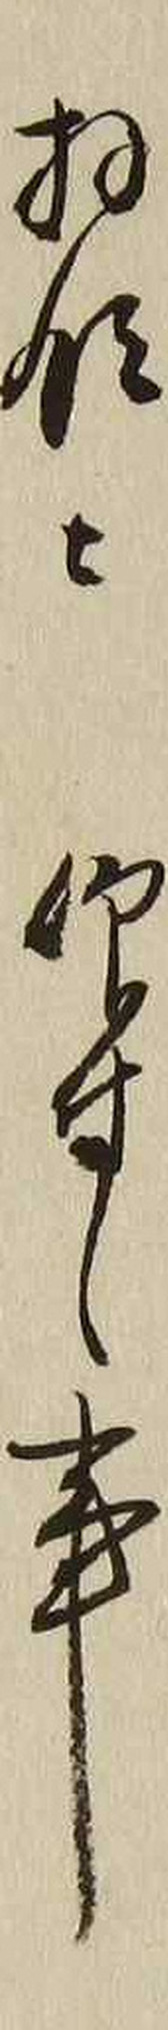拝領被仰付候事
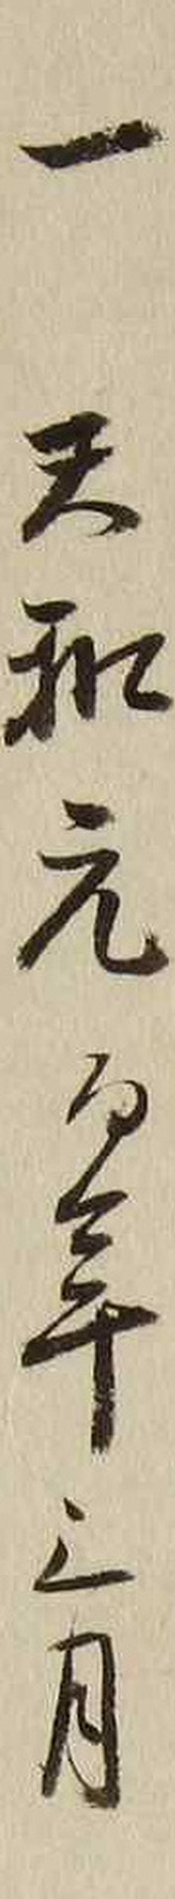一天和元酉年三月
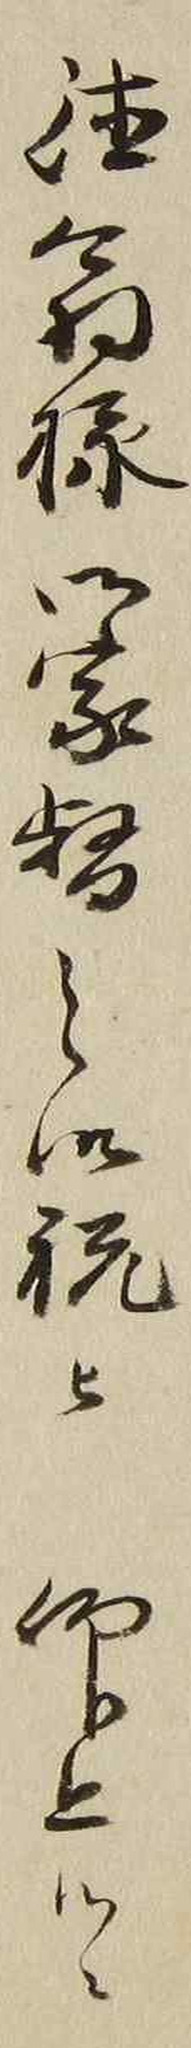徳翁御家督御祝被仰上候に
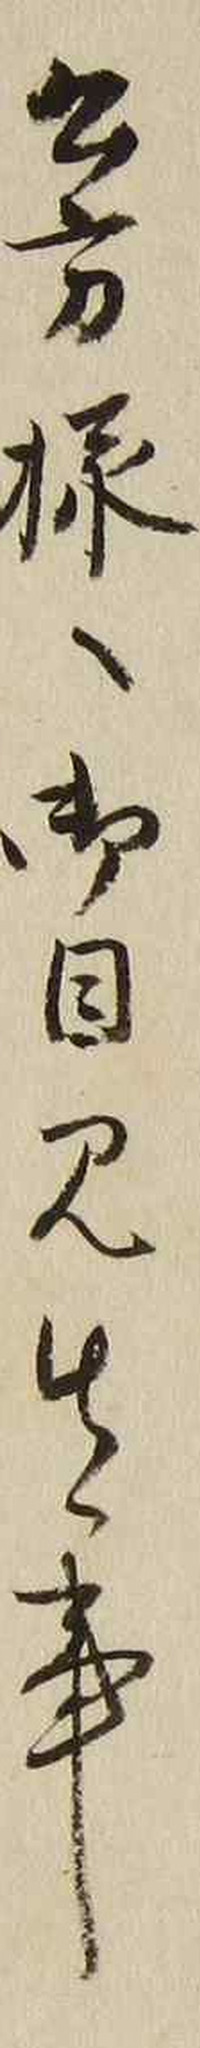公方様へ御目見仕候事
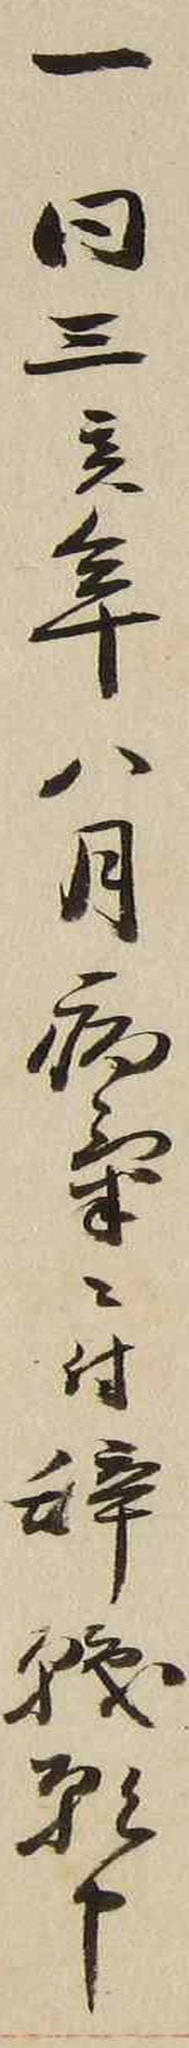一同三亥年八月病気に付辞職願申
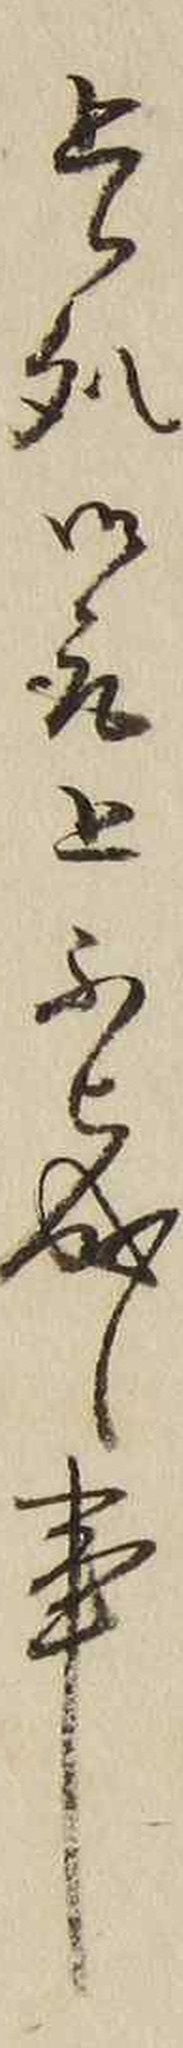上候処御取上不被成候事

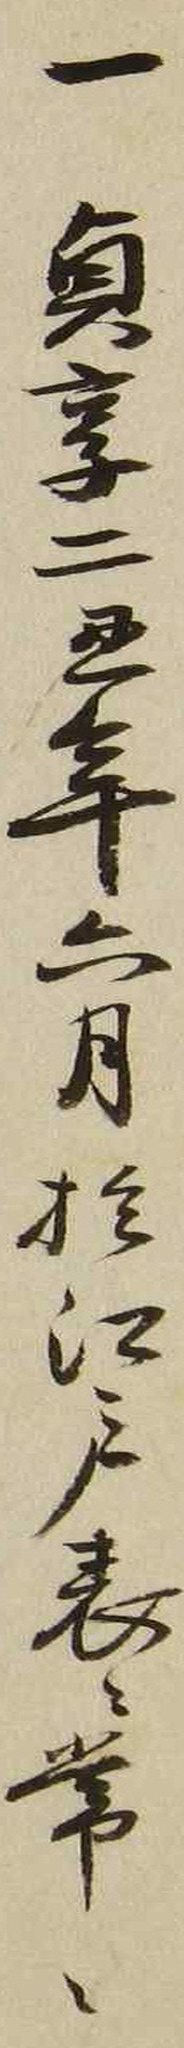一貞享二丑年六月於江戸表に常々
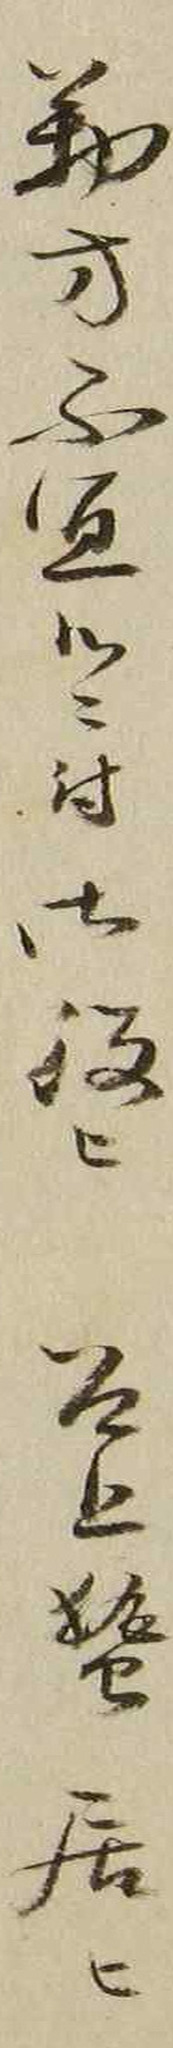勤方不宜候に付御役被召上蟄居被
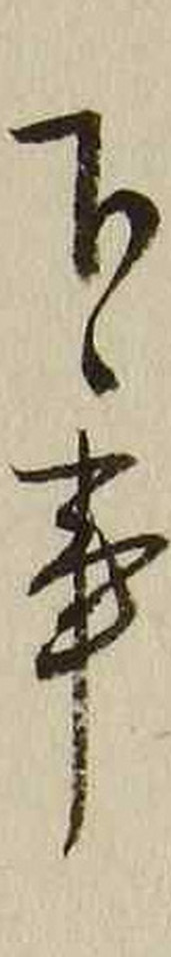下候事
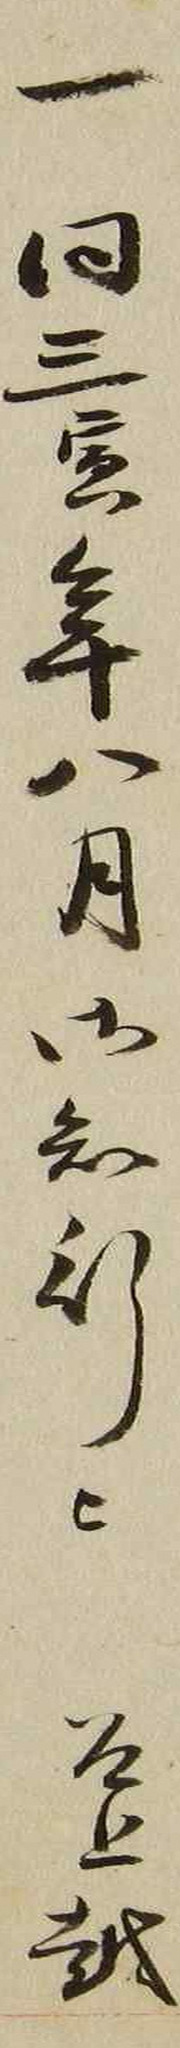一同三寅年八月御知行被召上越
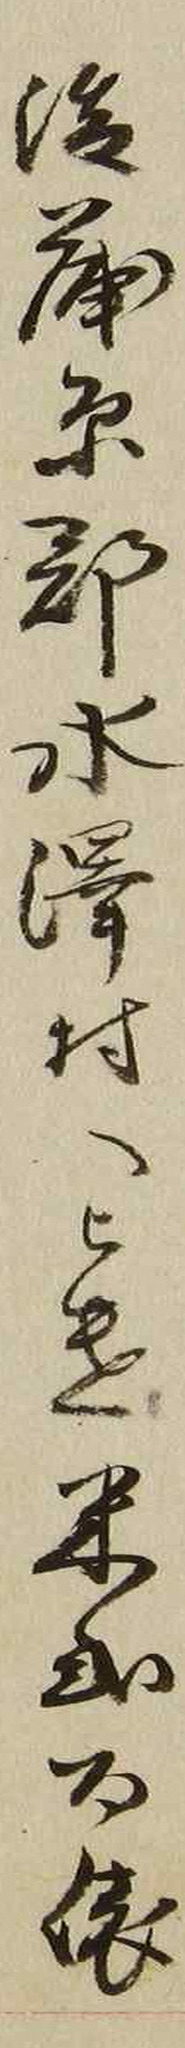後蒲原郡水沢村へ遣米弐百俵
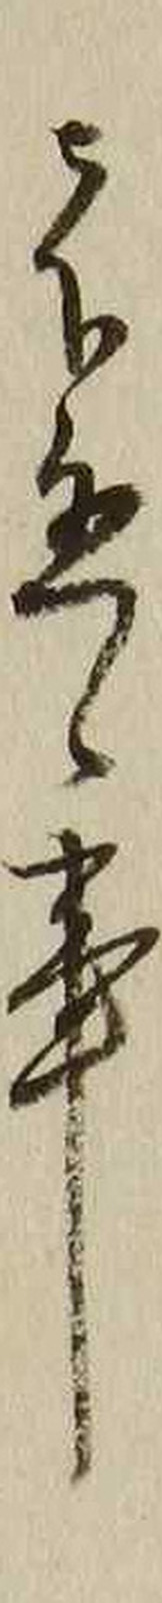被下置候事
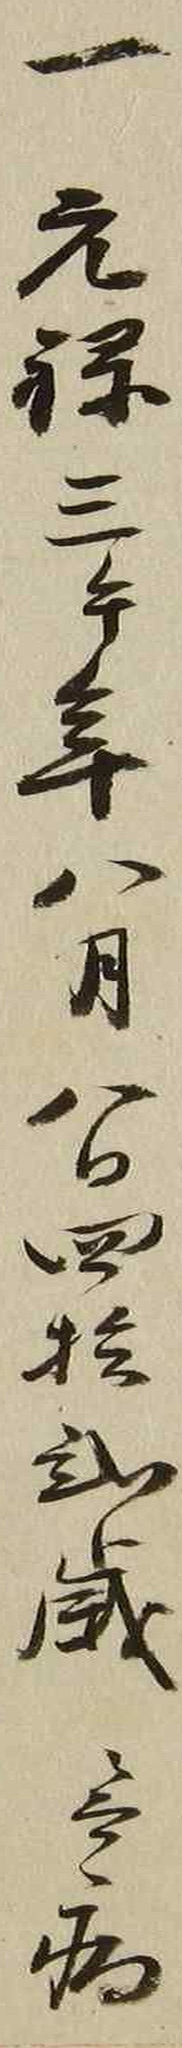一元禄三午年八月八日四拾弐歳に而病
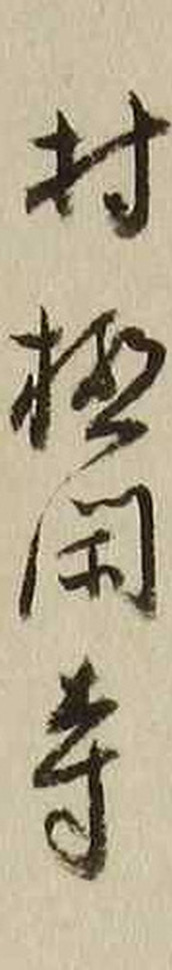村極閑寺
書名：諸士系譜　巻之269　さ之部1
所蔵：会津若松市立会津図書館
